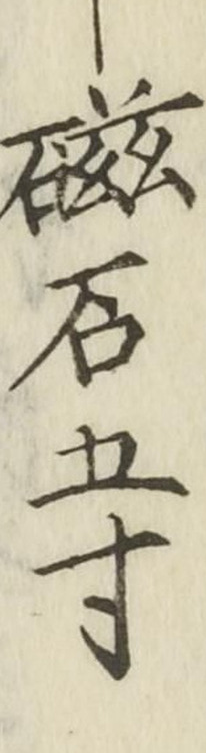磁石五寸
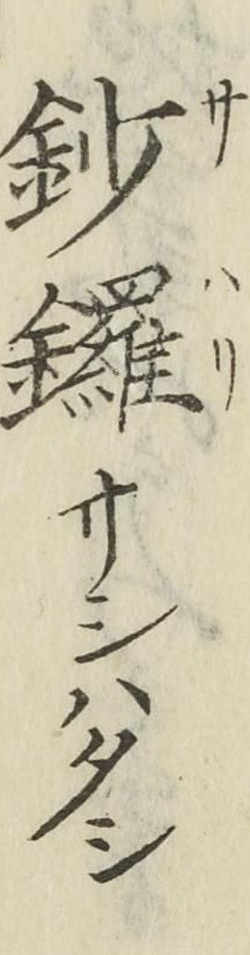鈔鑼サシハタシ
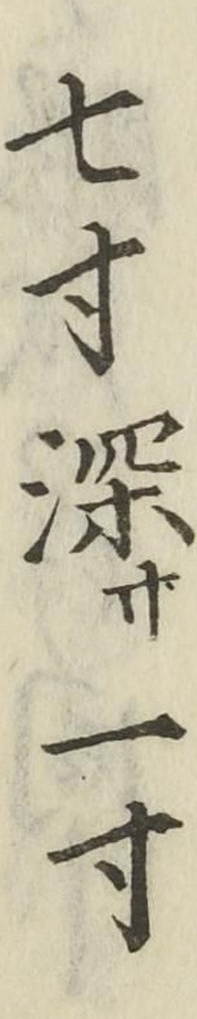七寸深サ一寸
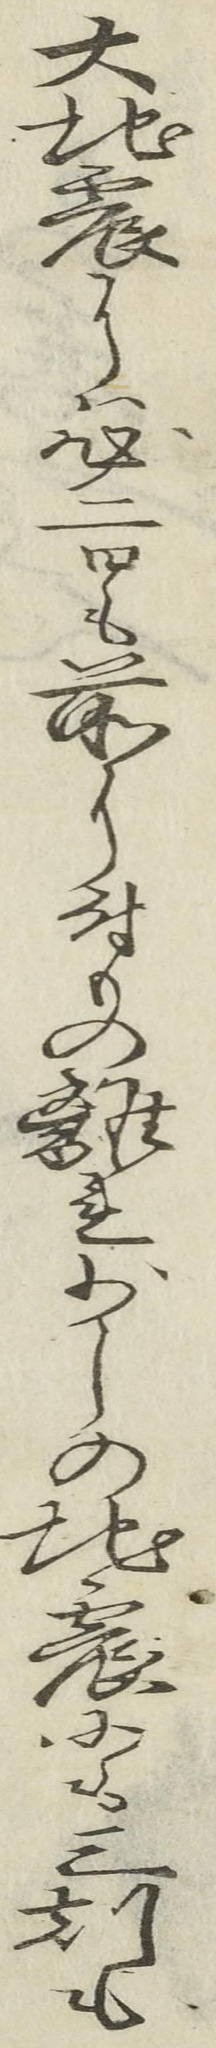大地震には必二日も前に付きもの離れ少しの地震にも三刻も
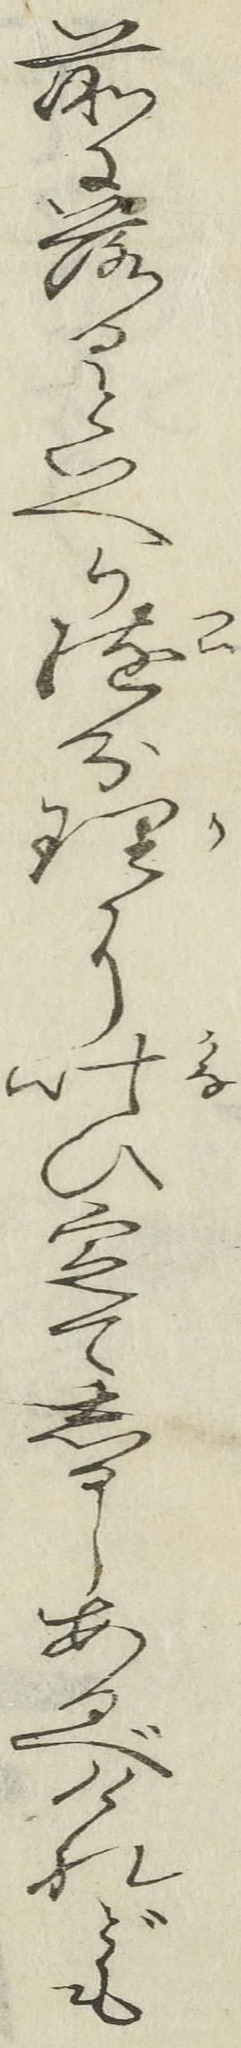前に落るといへり随分理に叶ひ定てしるしあるべけれども
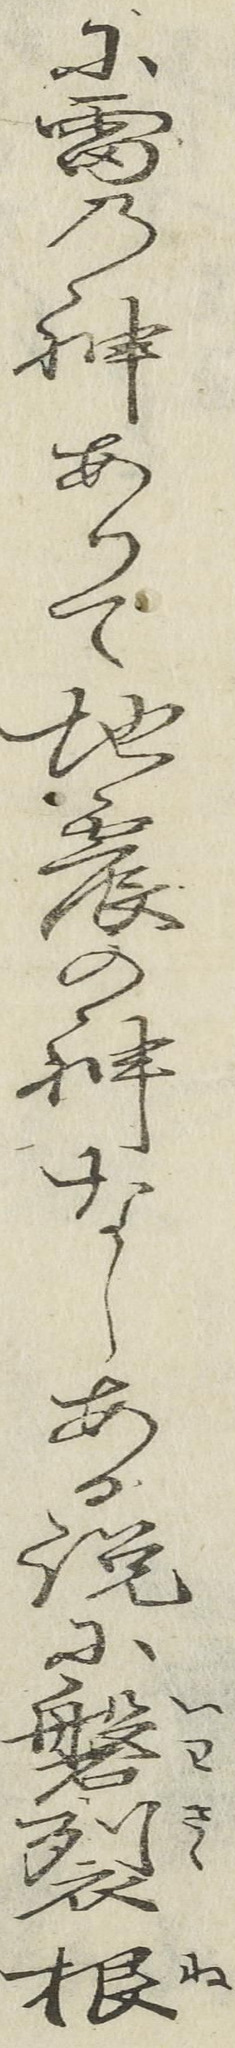に雷の神ありて地震の神なしある説に磐裂根
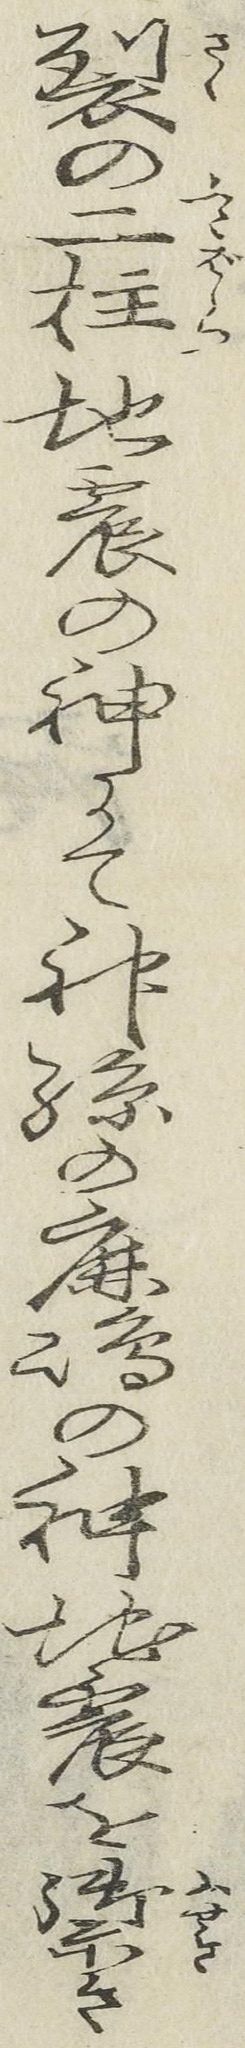裂の二柱地震の神にて神孫の鹿嶋の神地震を禦きき
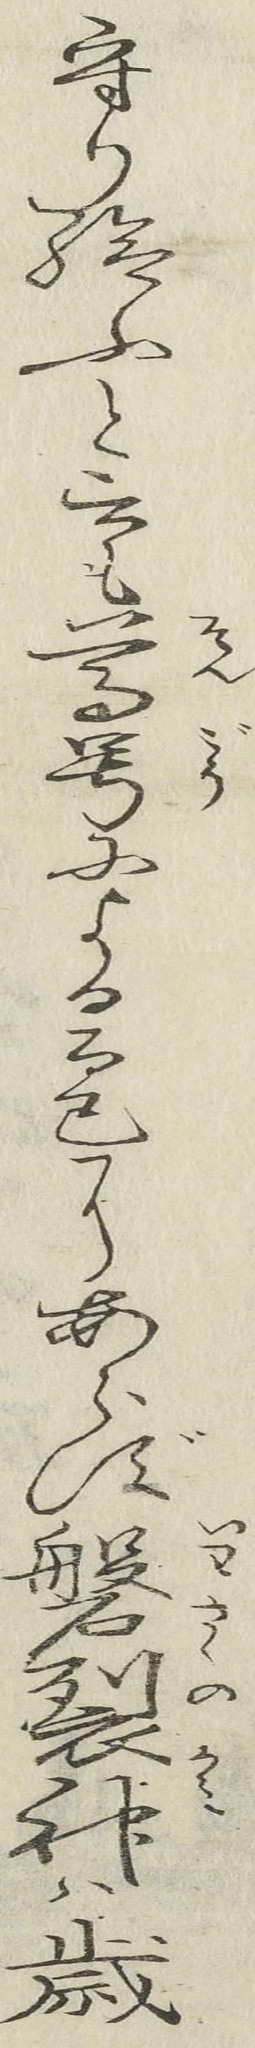守り給ふと云も尊号による而己にあらず磐裂神は歳
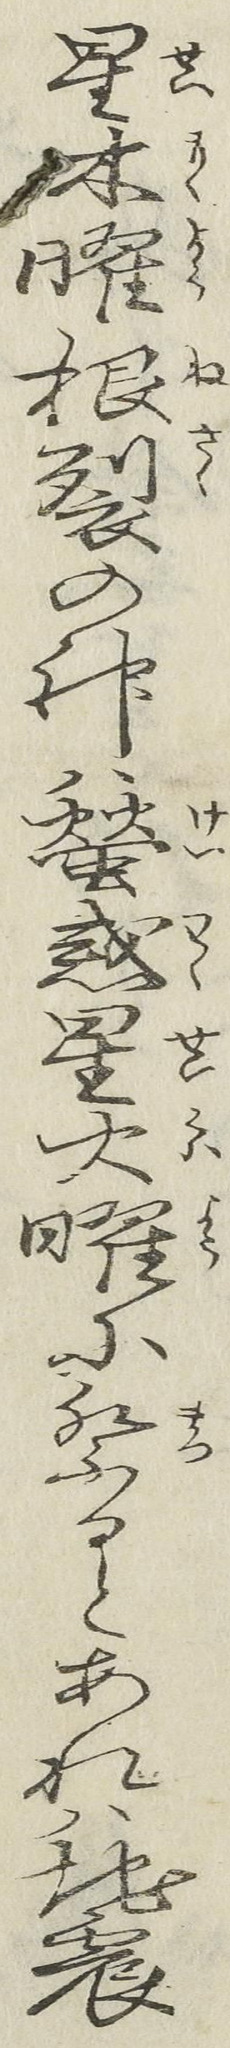星木曜根裂の神は螢惑星火曜に祭るとあれは地震
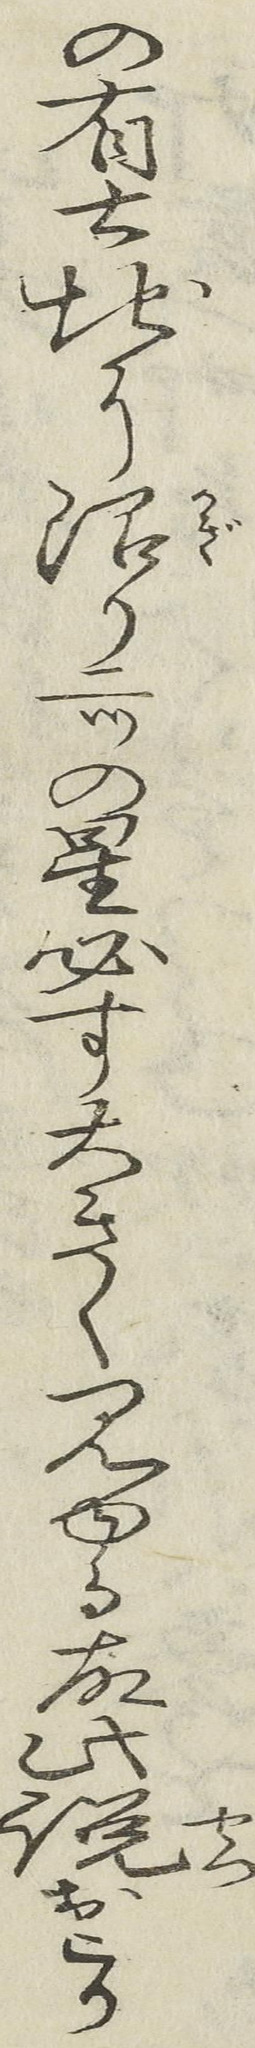の有土地に限り二ツの星必す大きく見ゆる故此説おこり
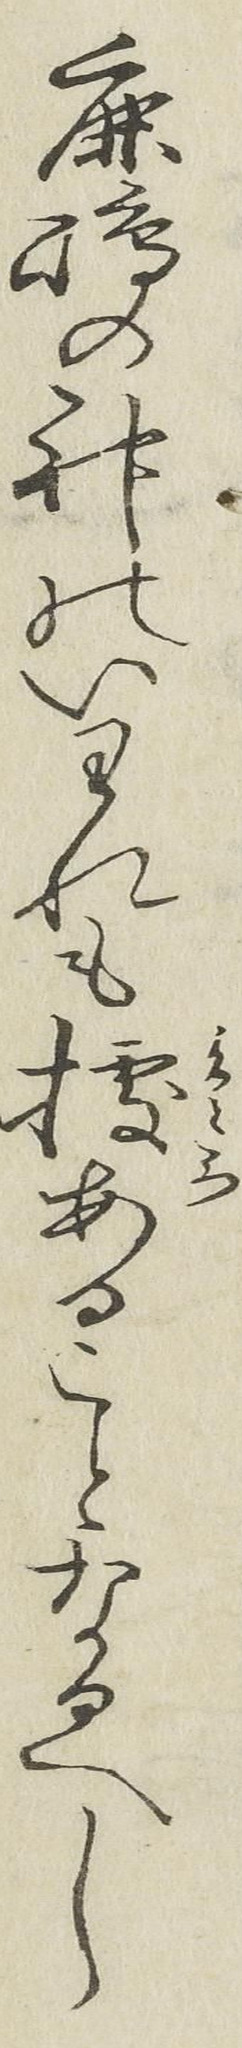鹿嶋の神のいわれも拠あることなるへし

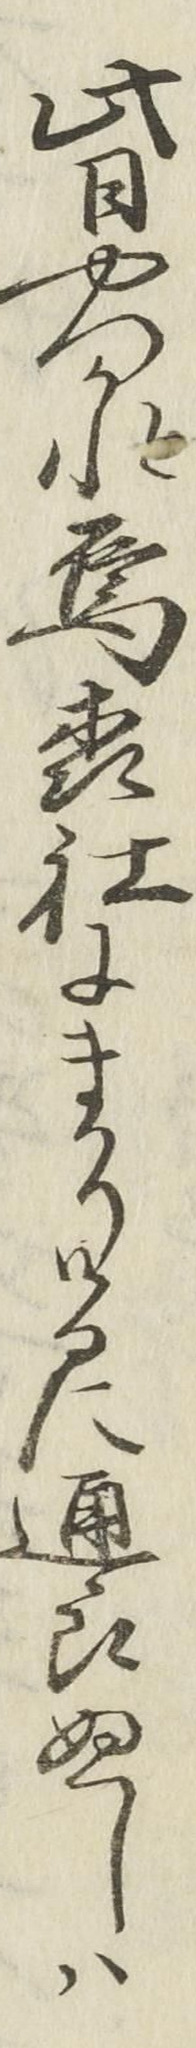此日やつかれ烏森社にまつりけるに通良ぬしは
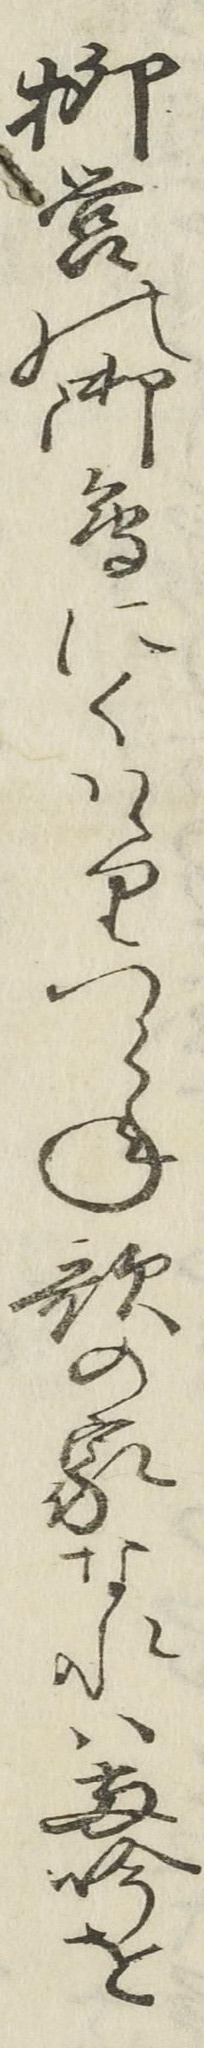柳営の御鳥にくはゝりつらね歌の家なれは両吟を
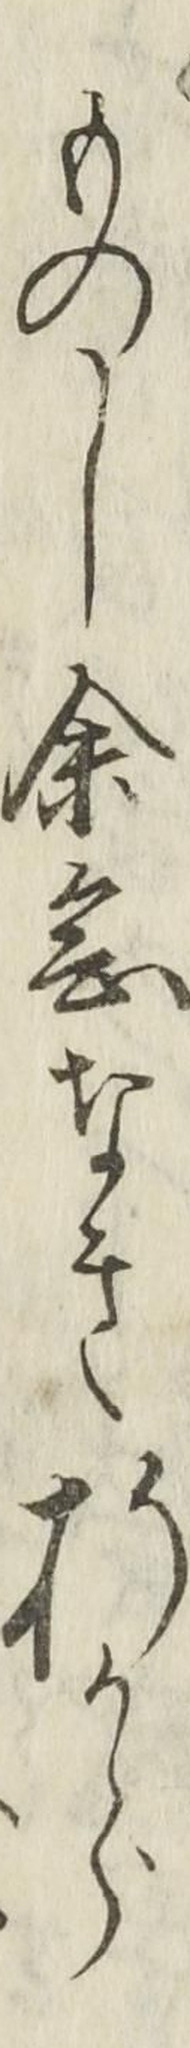ものし余念なき折から
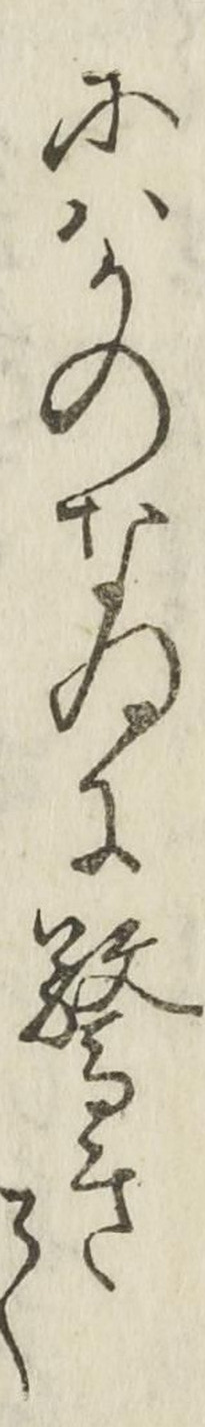にはかのなゐに驚きて
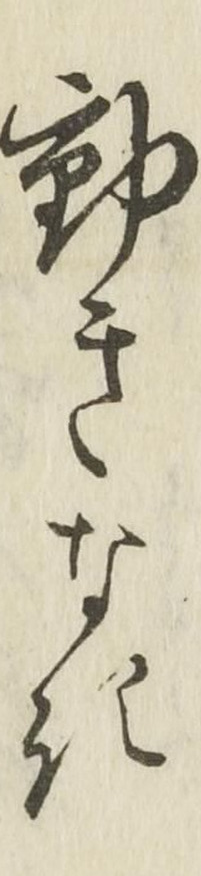動きなき
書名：震雷考説　全
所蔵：東京大学地震研究所図書室 Earthquake Research Institute Library, The University of Tokyo, JAPAN
